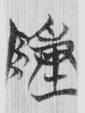陳
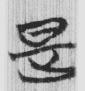是
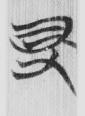𠭁
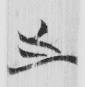之
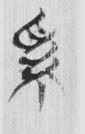奚
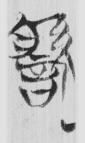䌛
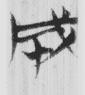成
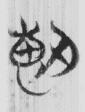{叀刃}
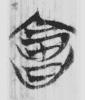會
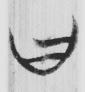曰
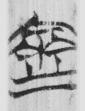齊
